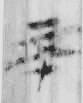不
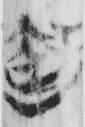智（知）
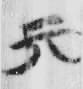亓（其）
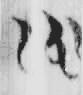州
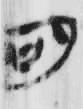名
